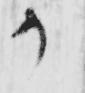人
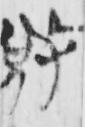敓
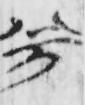○（賓）
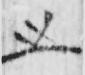之
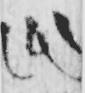州
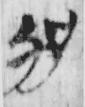加
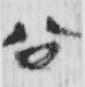公
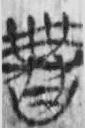○（許）
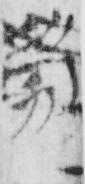○（勝）
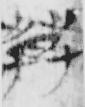登
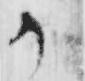人
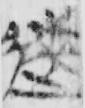遠
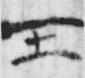壬
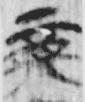奠
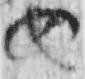它
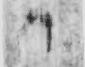人
